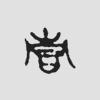青
